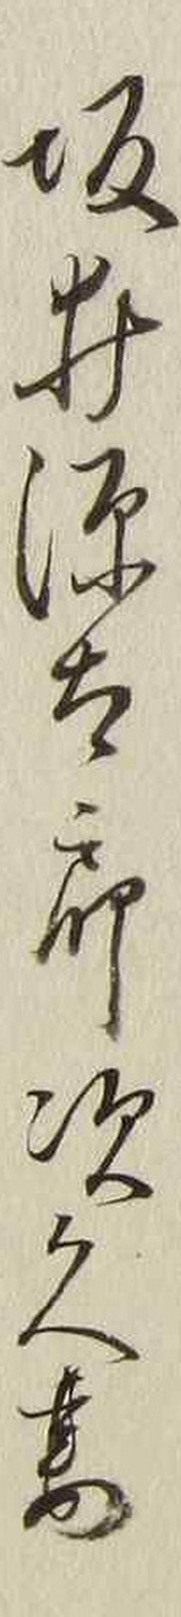女坂井源太郎次久妻

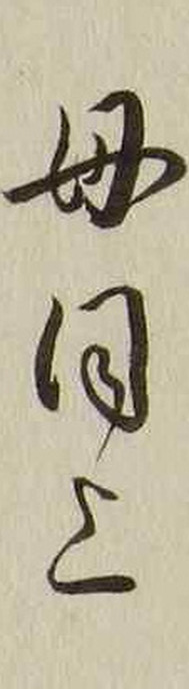母同上
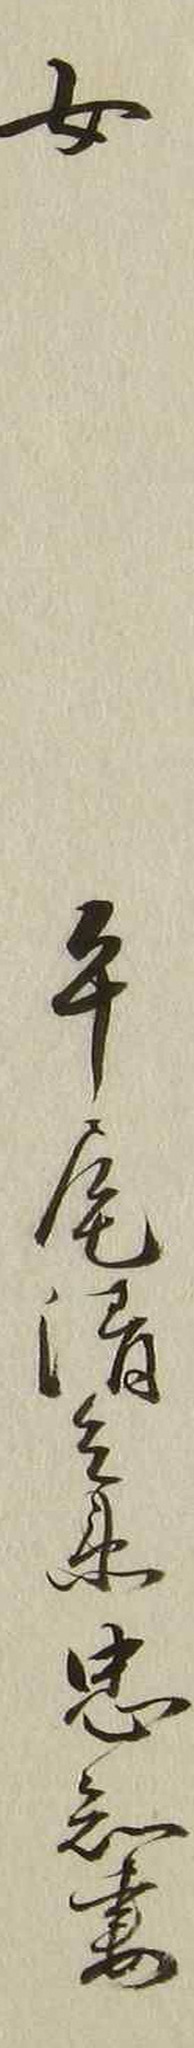女牛尾清兵衛忠知妻
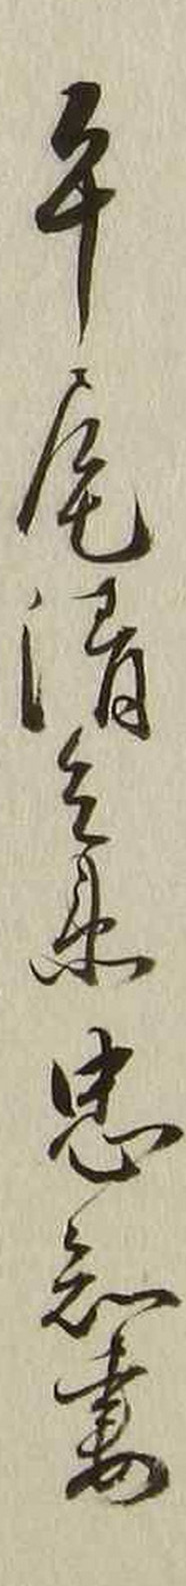女牛尾清兵衛忠知妻
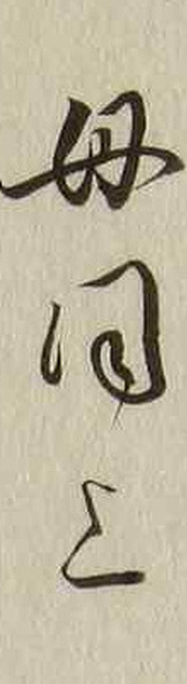母同上
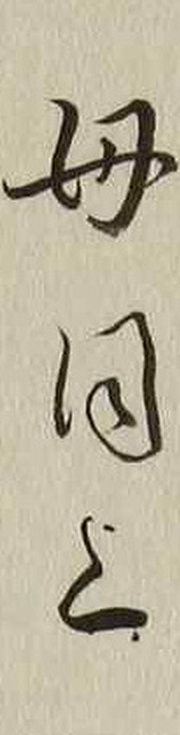母同上
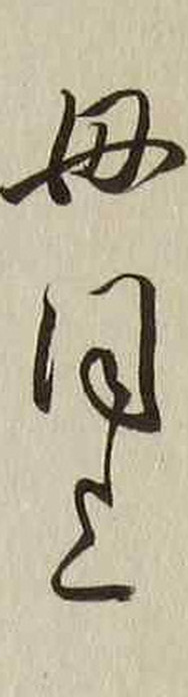母同上
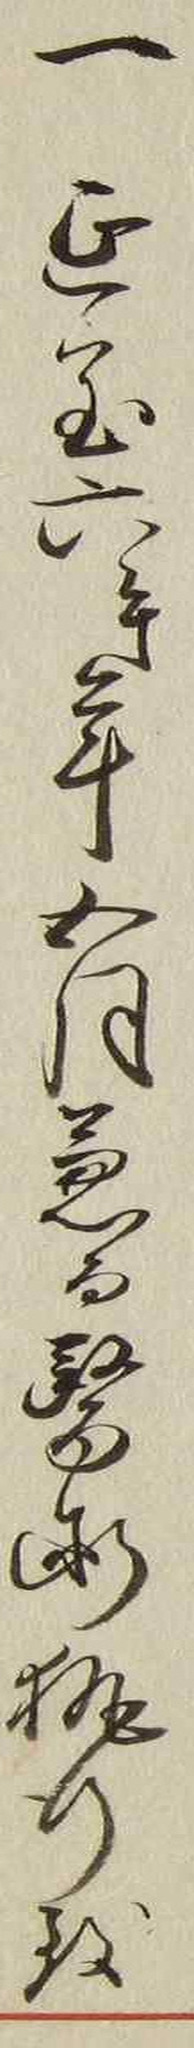一延六午年五月兼ねて医術執行致し

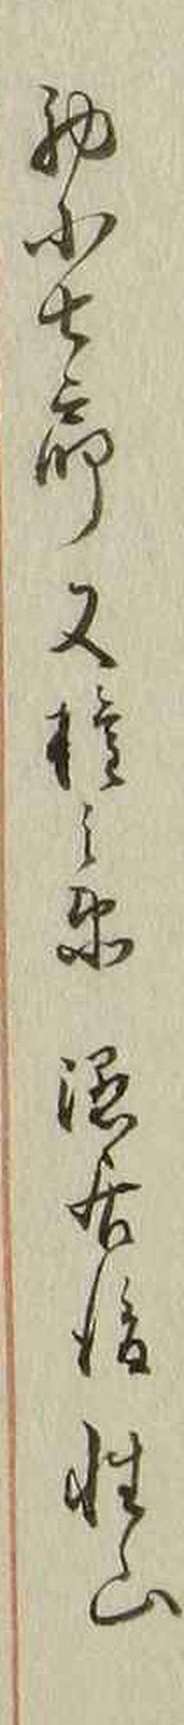初小七郎又権之丞隠居後性山
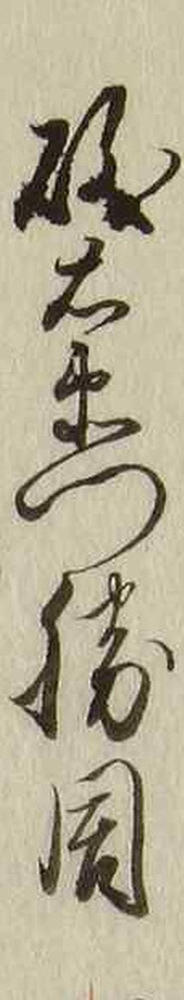磯右衛門勝周
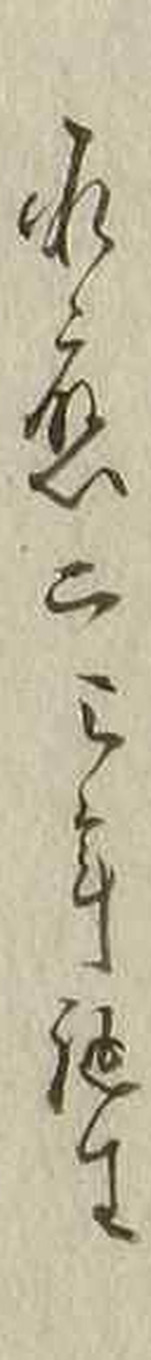承応二巳年誕生
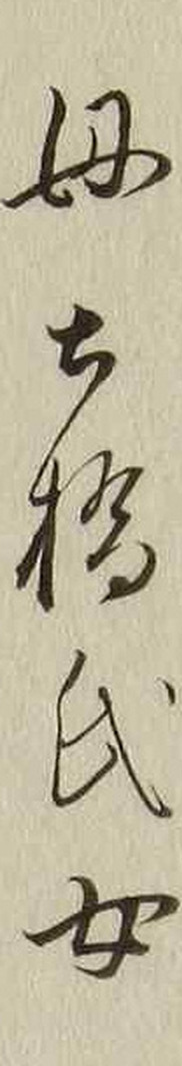母土橋氏女
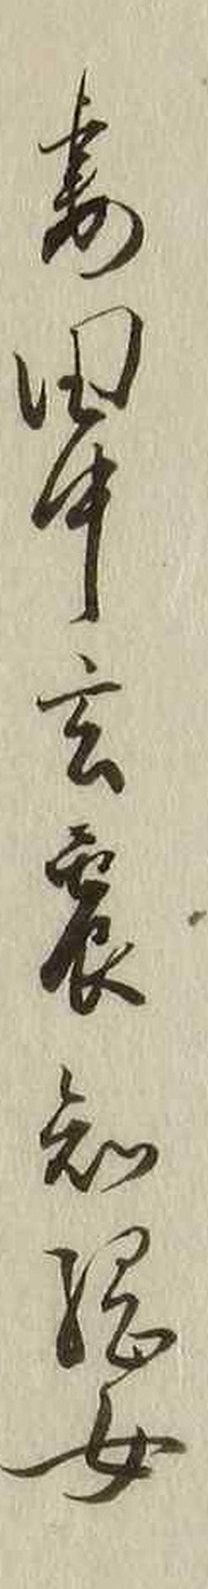妻田中玄震知穏女
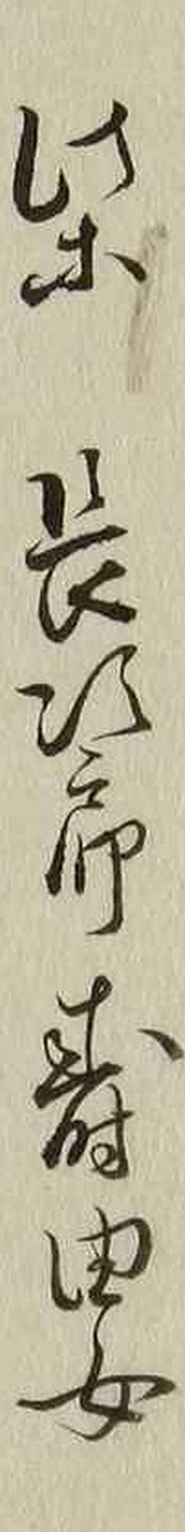柴長次郎壽由女
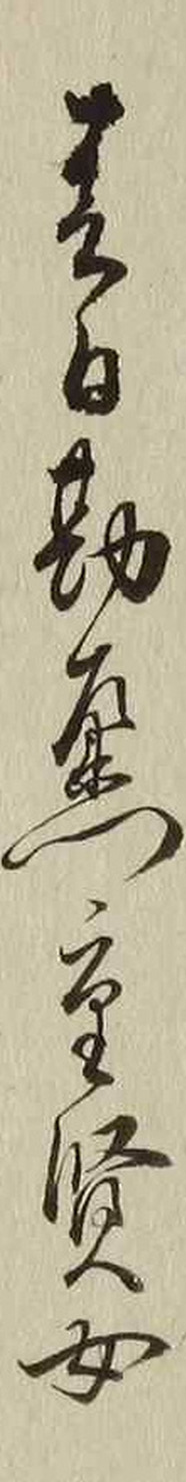春日勘左衛門重賢女
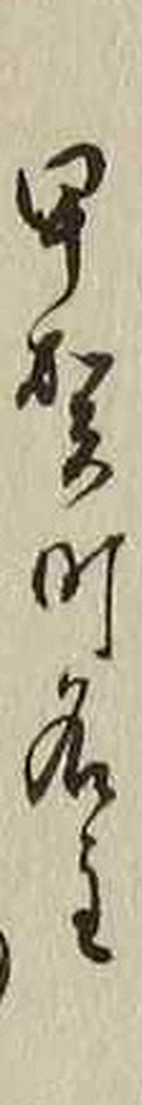甲賀町名主
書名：諸士系譜　巻之20　い之部20
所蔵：会津若松市立会津図書館
